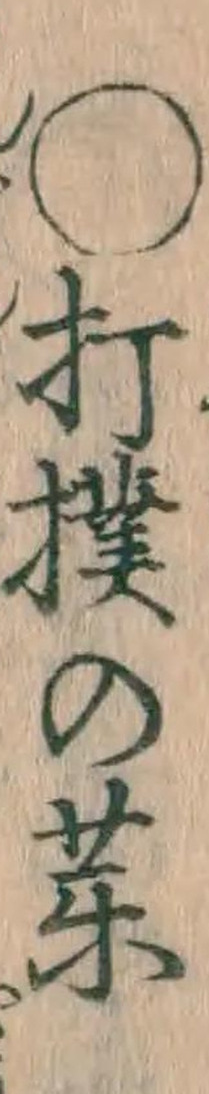○打撲の薬
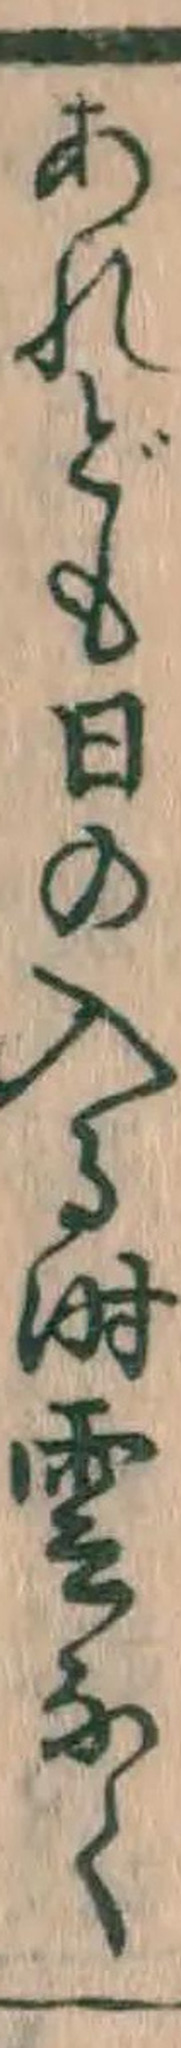あれども日の入る時雲なく
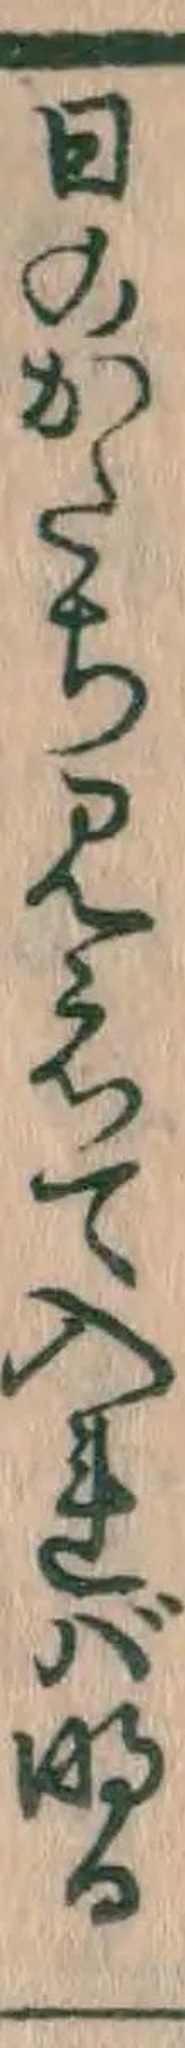日のかたち見えて入れば明日
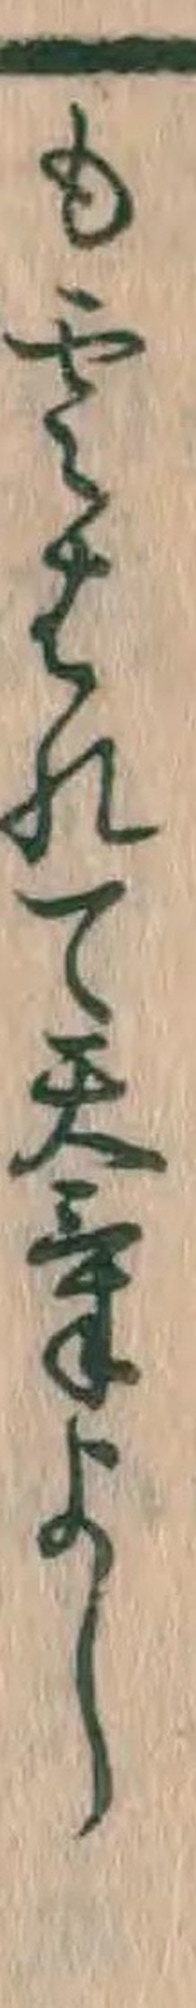も雲はれて天気よし
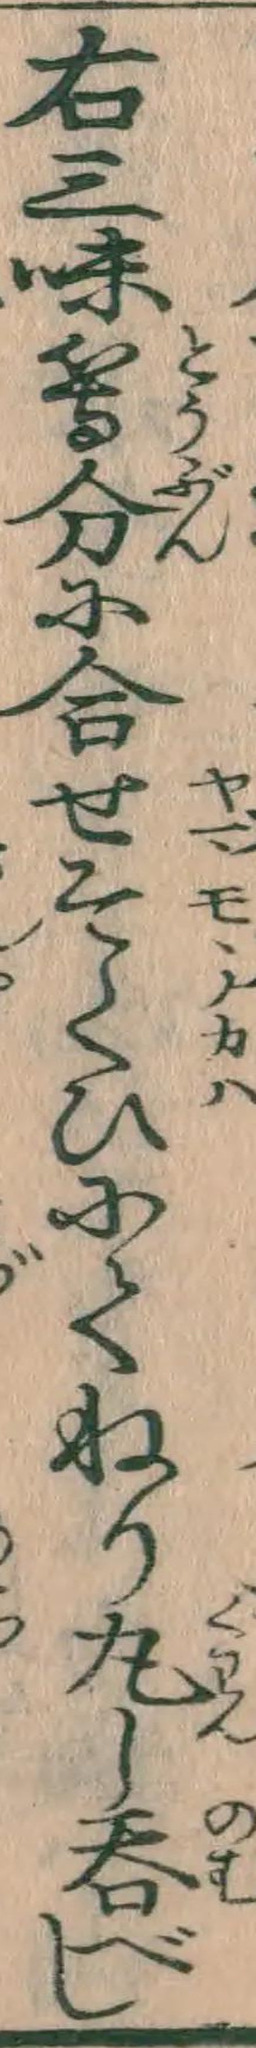右三味等分に合せそくひにてねり丸し吞べし
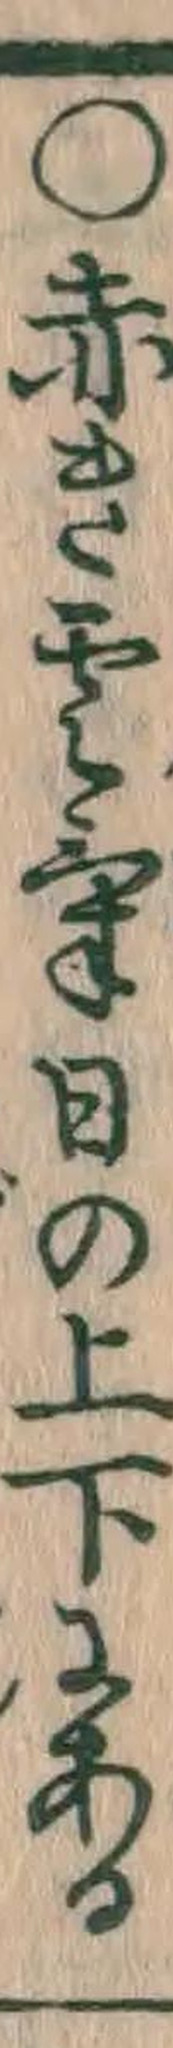○赤き雲気日の上下にある
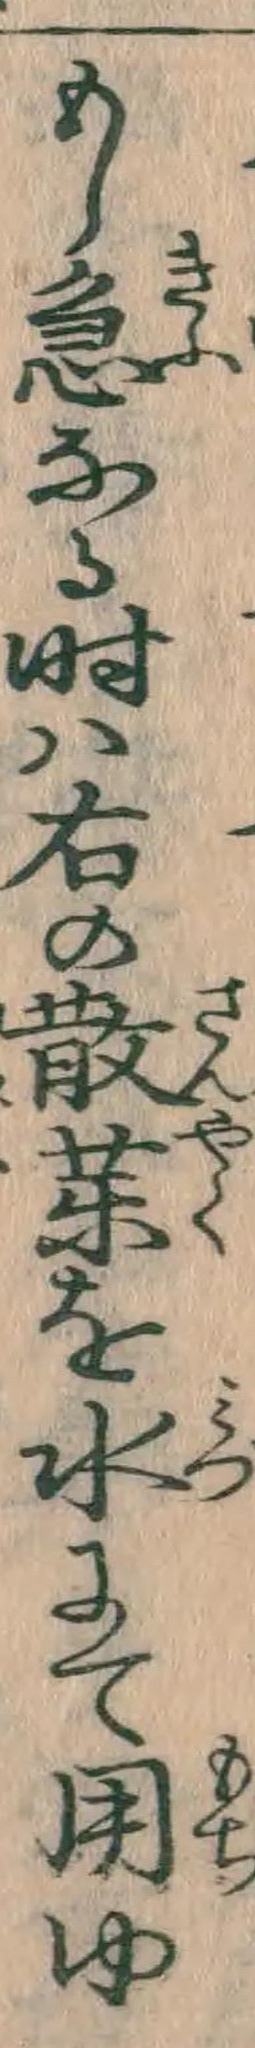もし急なる時は右の散薬を水にて用ゆ
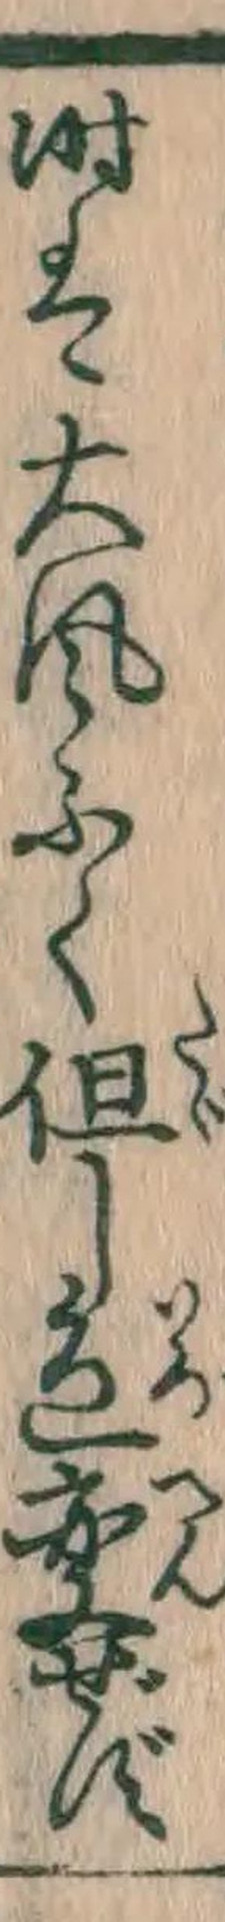時は大風ふく但し色変ぜず
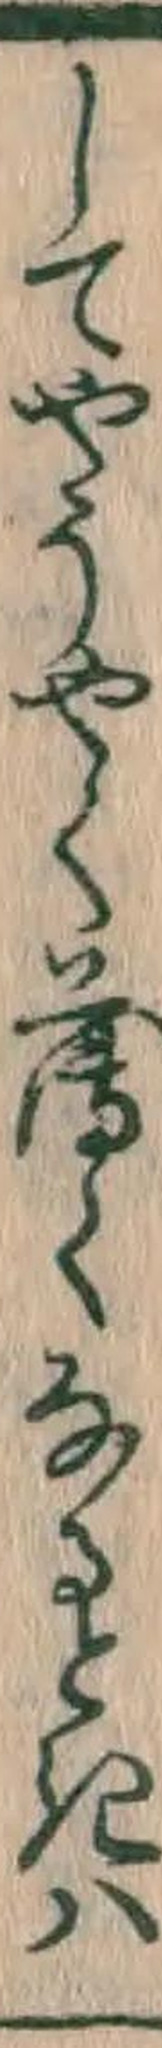してやうやく薄くなるときは
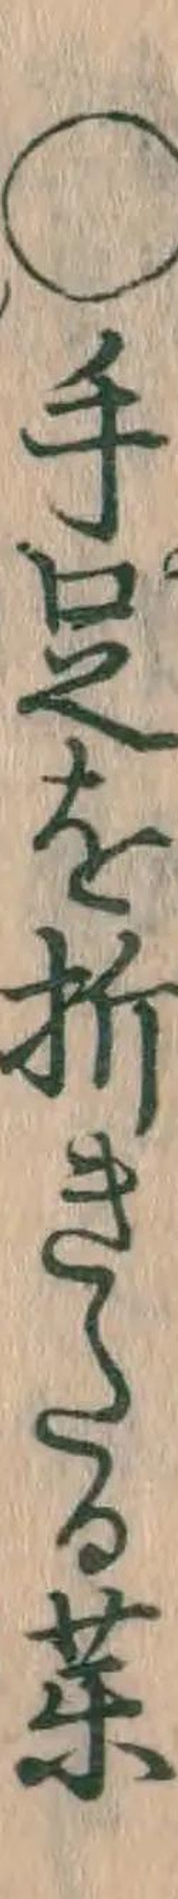○手足を折きたる薬
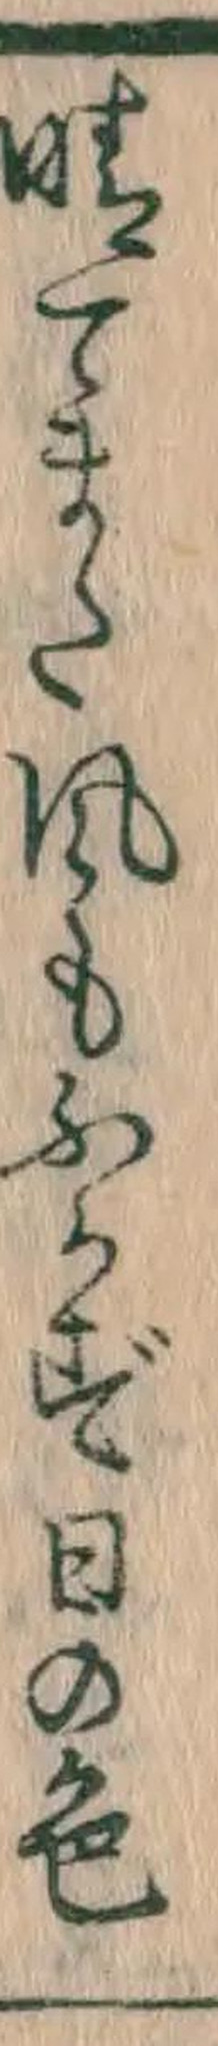晴てまた風もふかず日の色
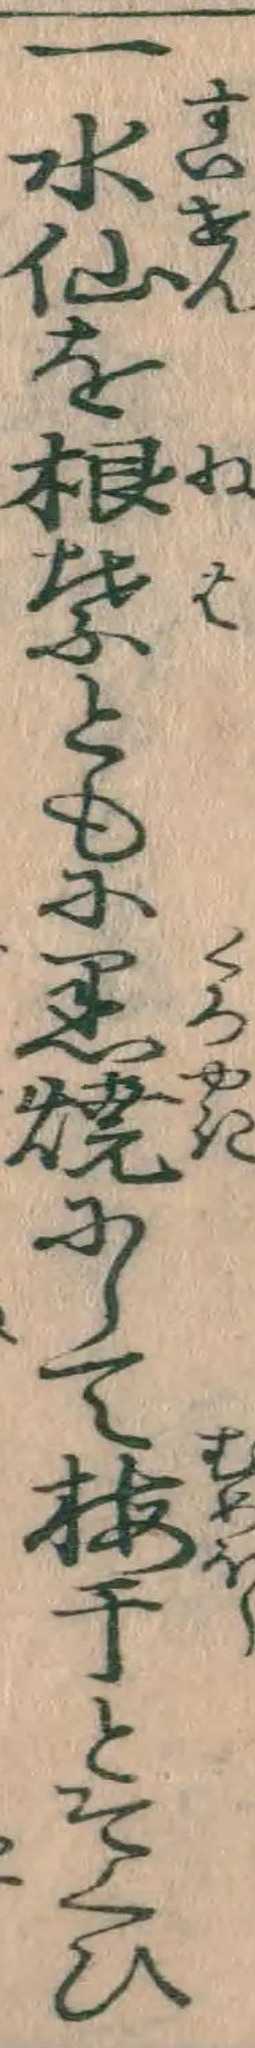一水仙を根葉ともに黒焼にして梅干とそくひ
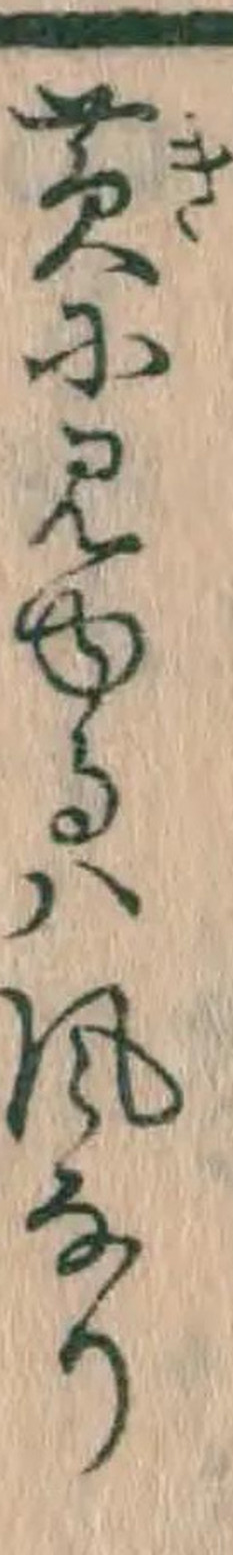黄に見ゆるは風なり
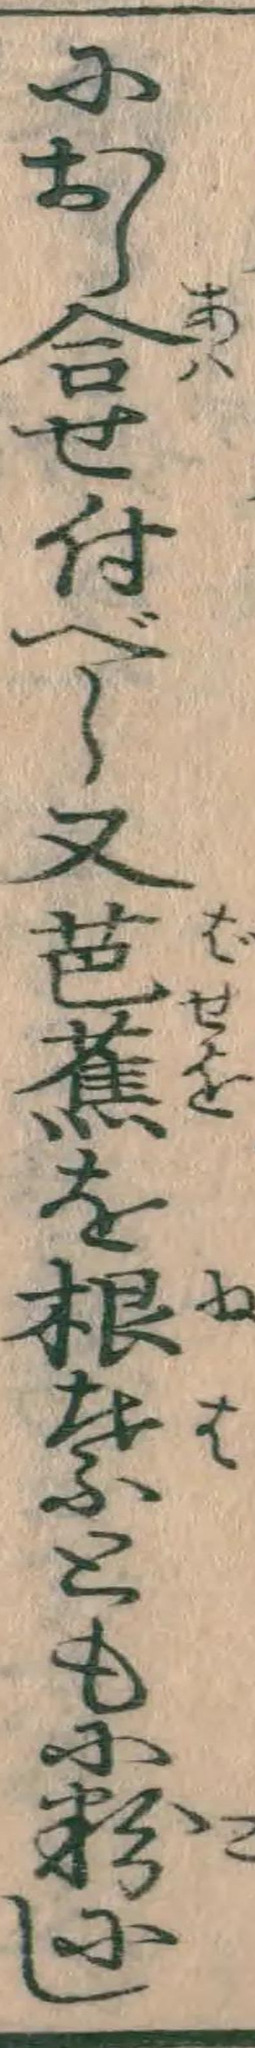におし合せ付べし又芭蕉を根葉ともに粉にし
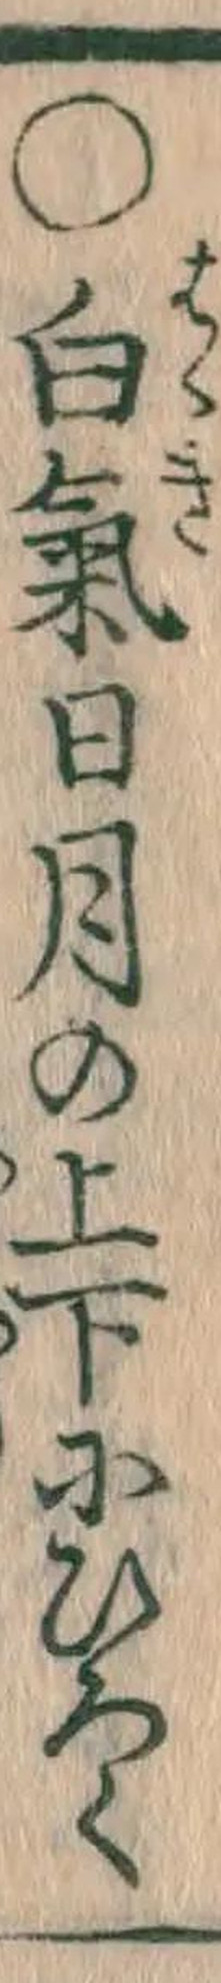○白気日月の上下にひろく
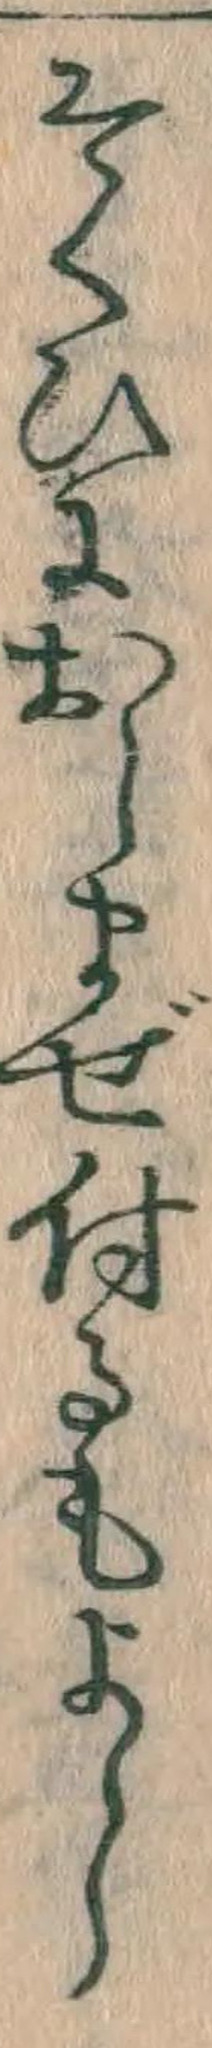そくひにおしまぜ付るもよし
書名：広益秘事大全 3巻. [3]
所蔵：国立国会図書館 National Diet Library, JAPAN
